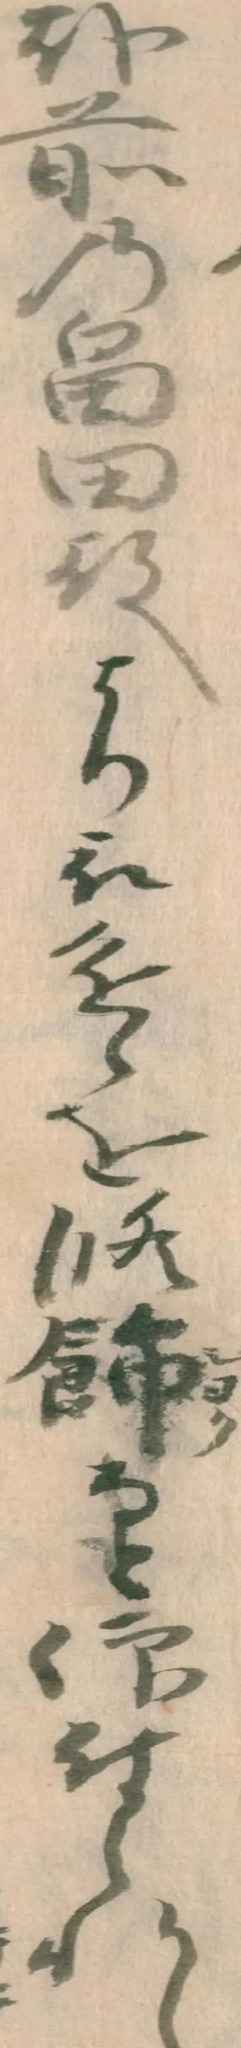越前の畠田殿より被進候を修飾なと仰付られし
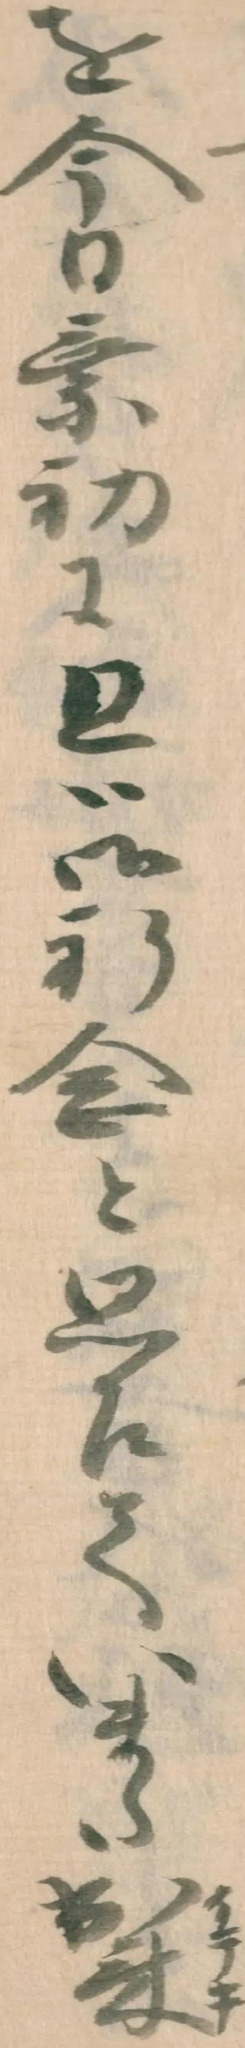を今日乗初に且は御祈念と思召ていまた出来
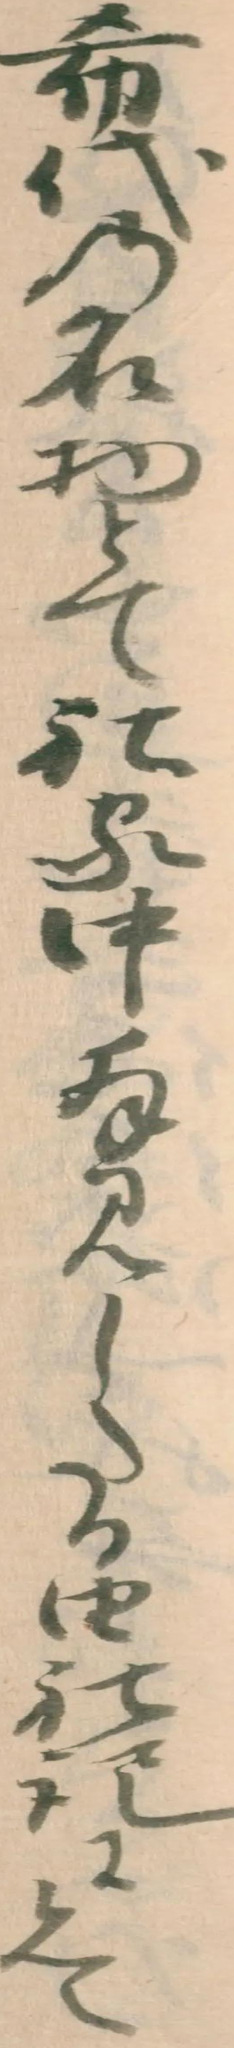希代の名物とて社家中拝見したる由社記に見え
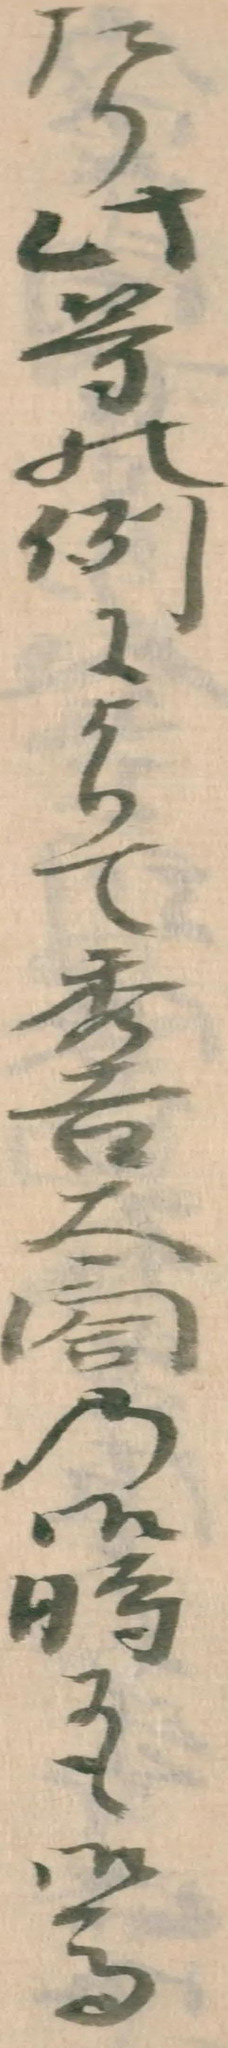たり此等の例によりて秀吉大閤の御時にも御馬
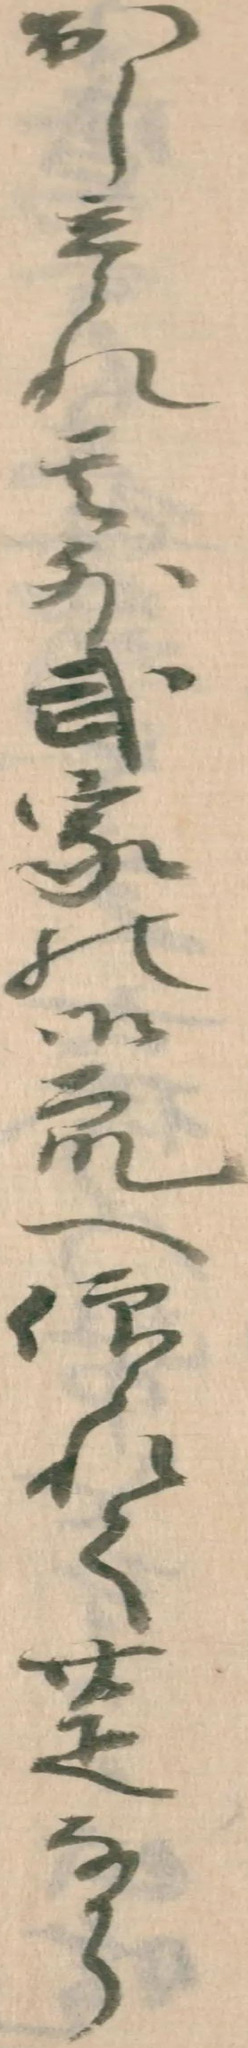出し立られ其外武家の御衆へ仰られて廿疋なから
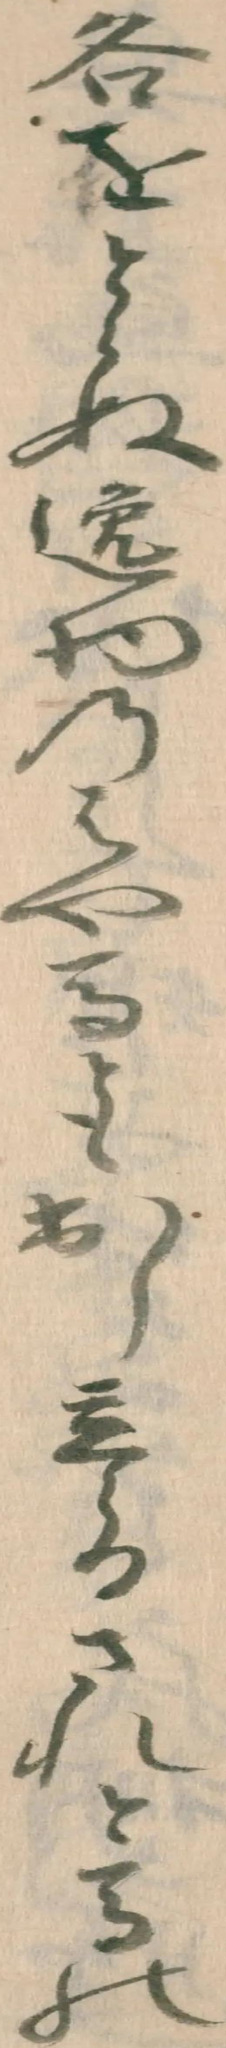各をとらぬ逸物のはや馬とも出し立らるされと馬の
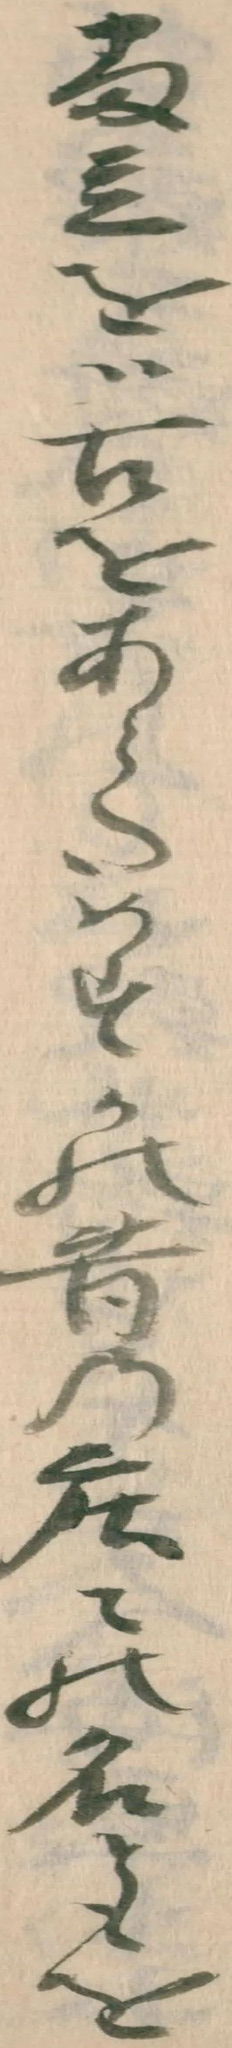番立をは古をあらためすかの昔の庄々の名ともを
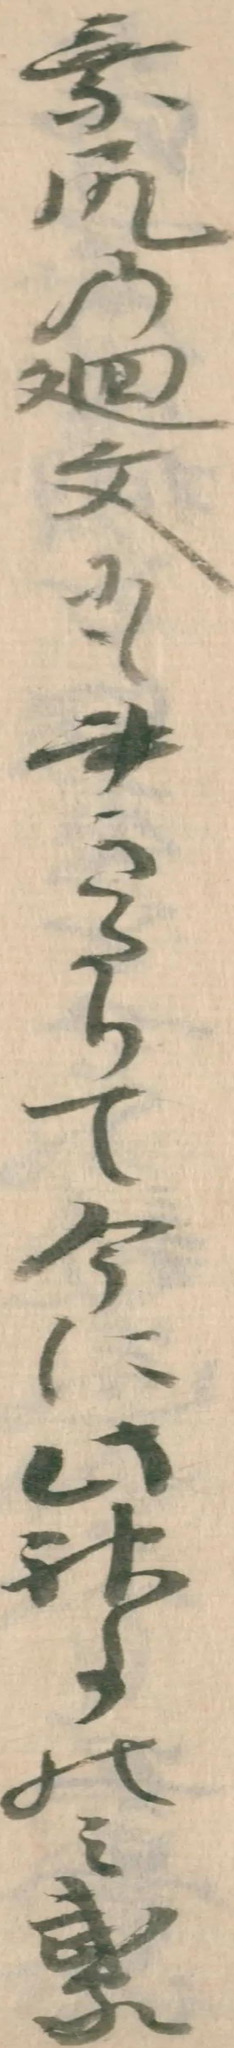乗尻の廻文にも書きたりて今に此神事のみ武家
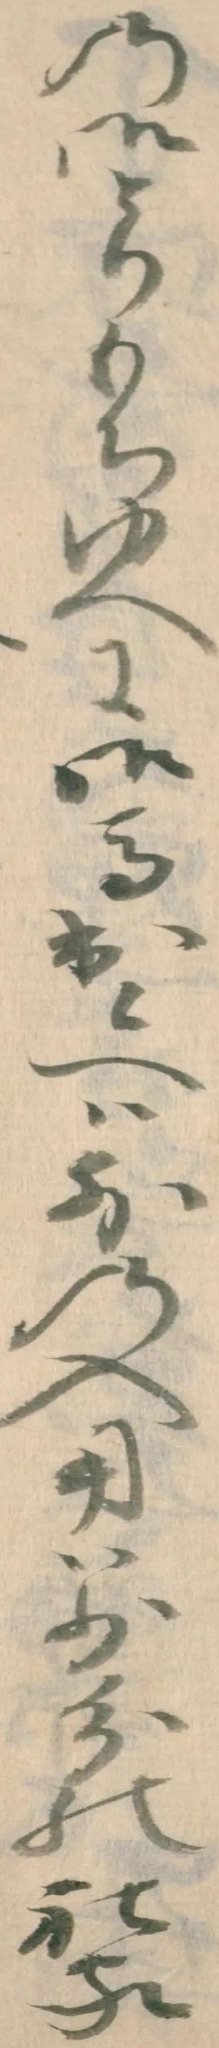の御とりもちゆへに御馬出候へは外の入用は少分の社家
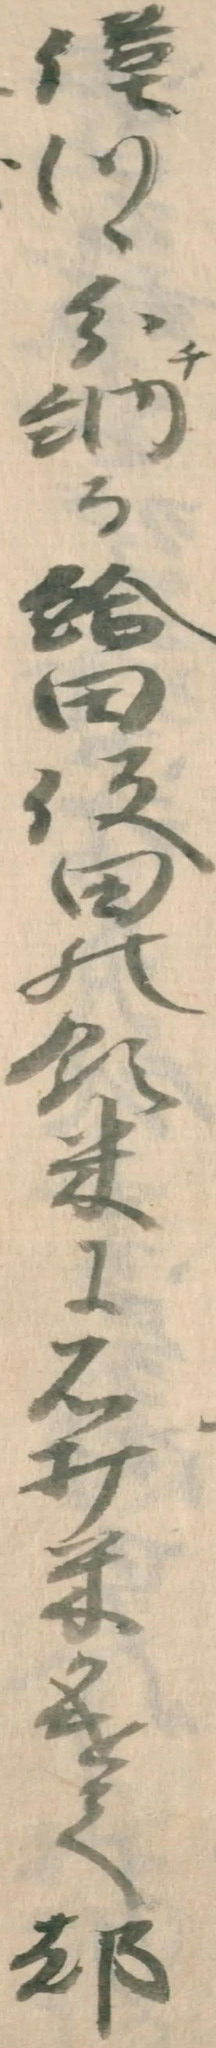僅つゝ分納る給田役田の領米に石打米かけて都
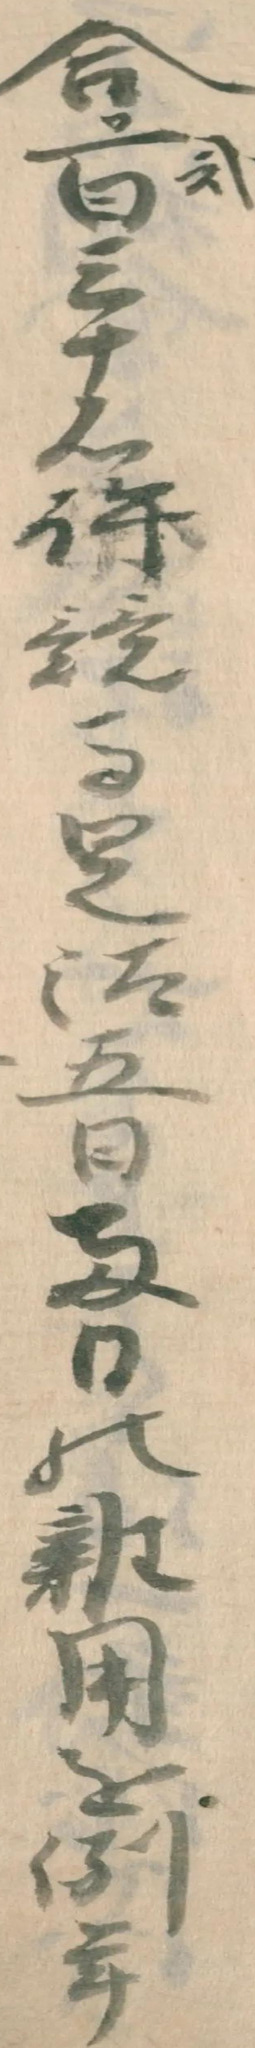合◦百三十石許競馬足汰五日両日の雑用を例年
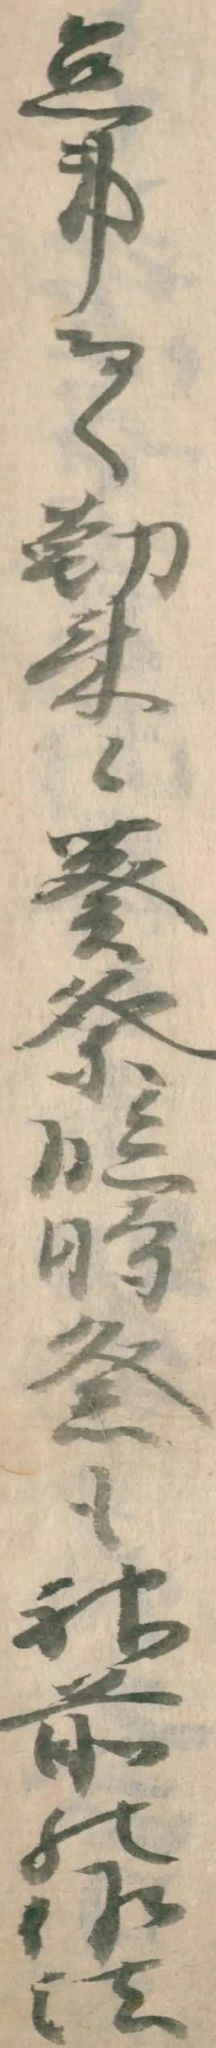怠事なく勤来候葵祭臨時祭も神前の作法

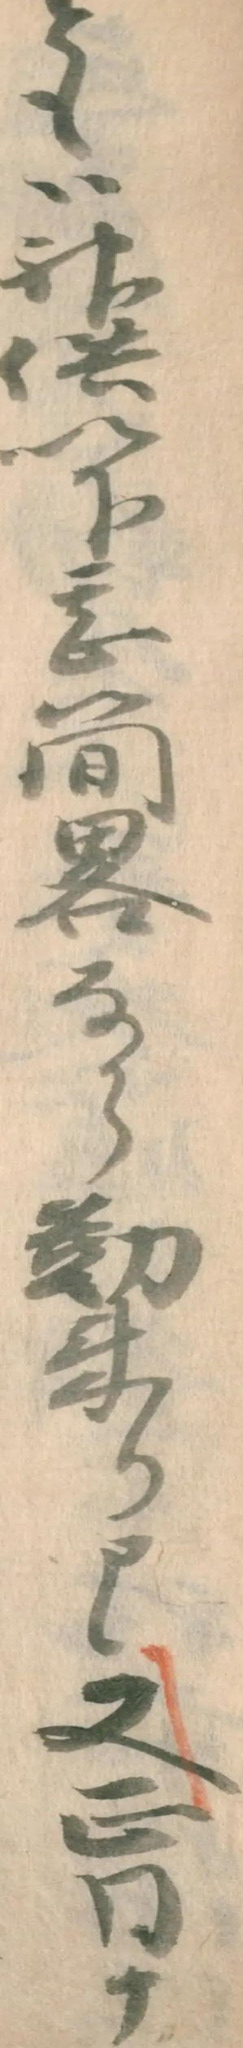ともは神供以下甚簡略なから勤来り申候又正月十
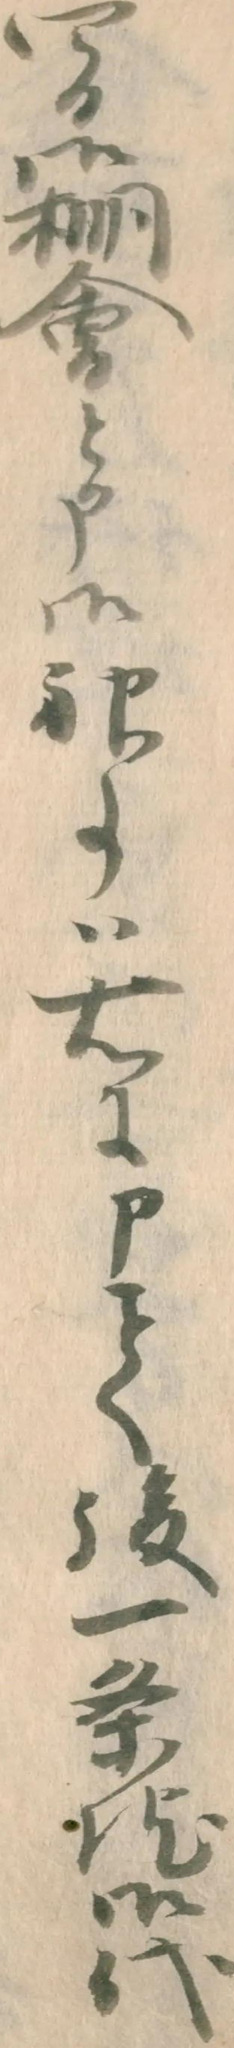四日御棚会と申御神事は右に申ことく後一条院御代
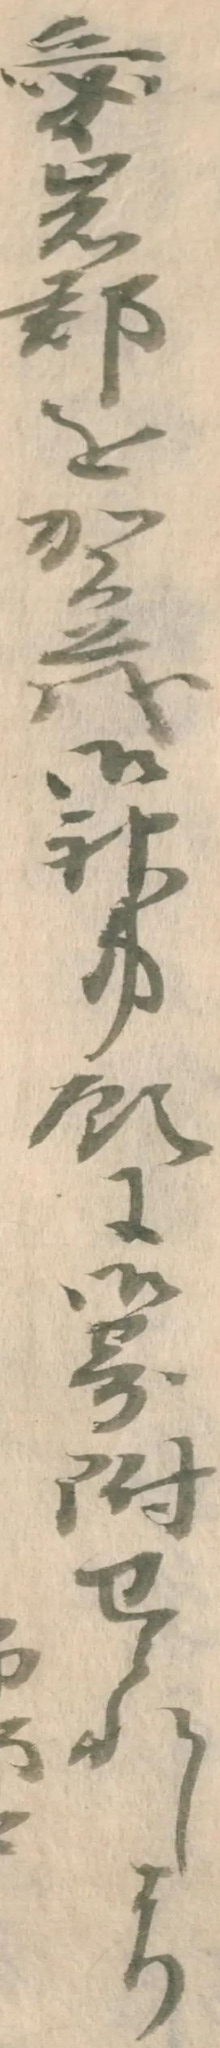愛宕郡を賀茂御神事領に御寄附せられしより
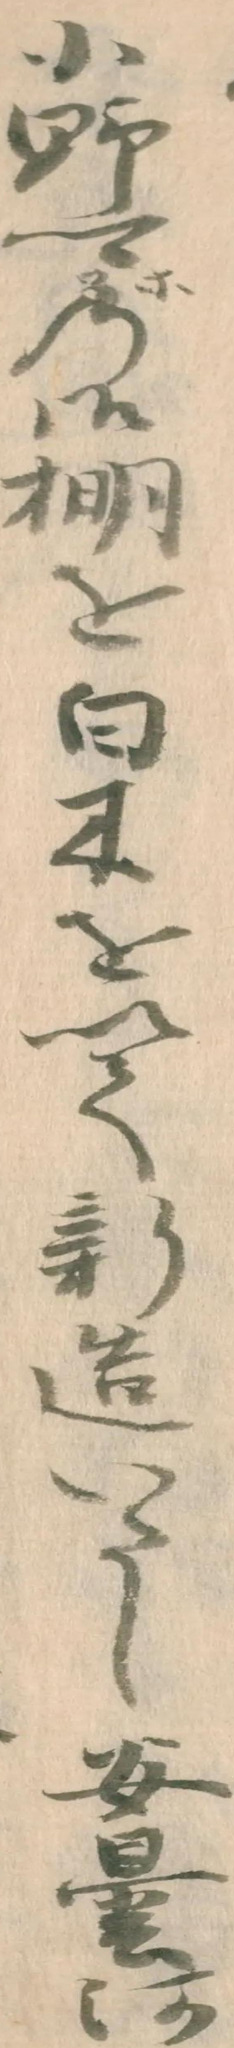小野郷◦の御棚を白木を以て新造いたし安曇河
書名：賀茂社記録. 第1冊
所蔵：国立国会図書館 National Diet Library, JAPAN
